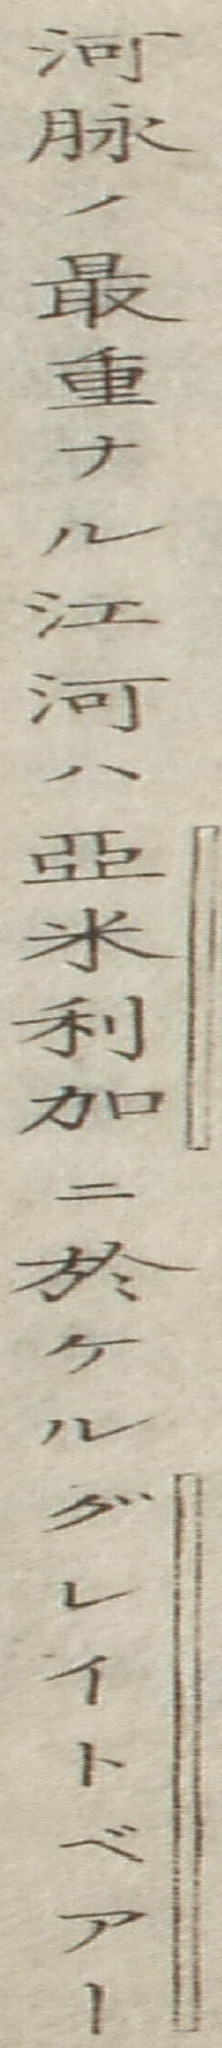河脈ノ最重ナル江河ハ亜米利加ニ於ケルグレイトベアー
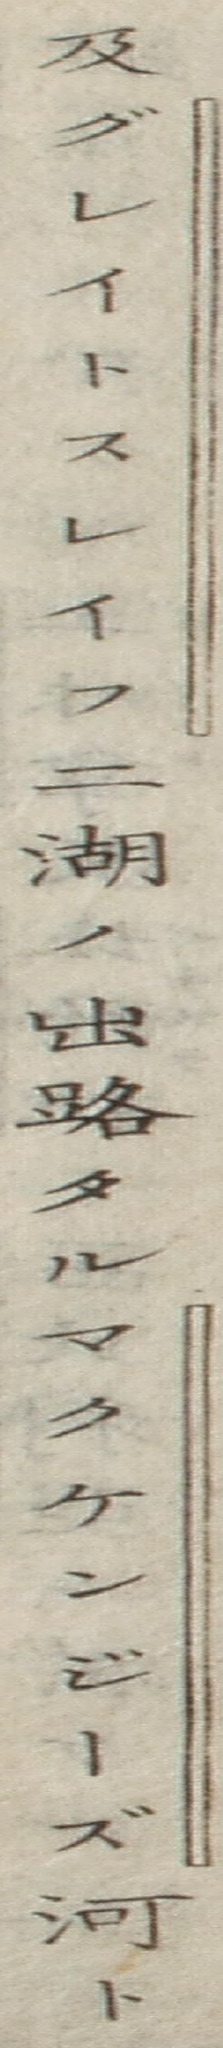及グレイトスレイフ二湖ノ出路タルマクケンジーズ河ト

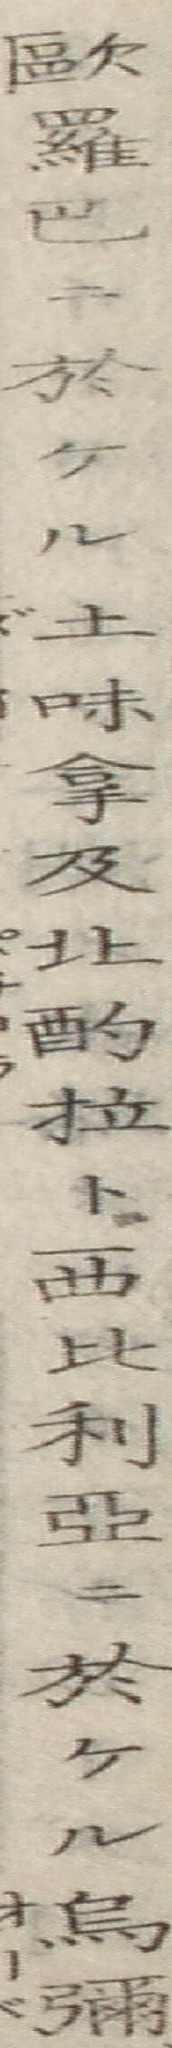欧羅巴ニ於ケル土味拿及北酌拉ト西比利亜ニ於ケル烏彌
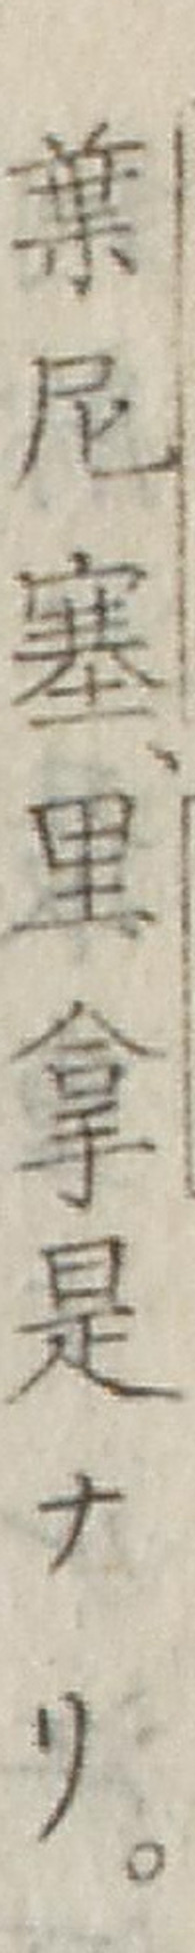兼尼塞、里拿是ナリ。
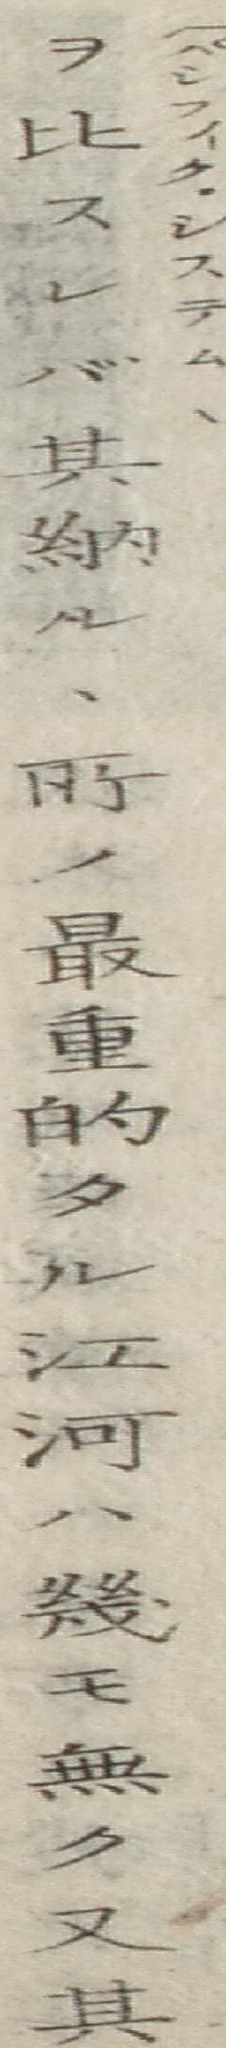ヲ比スレバ其納ルヽ所ノ最重的タル江河ハ幾モ無ク又其
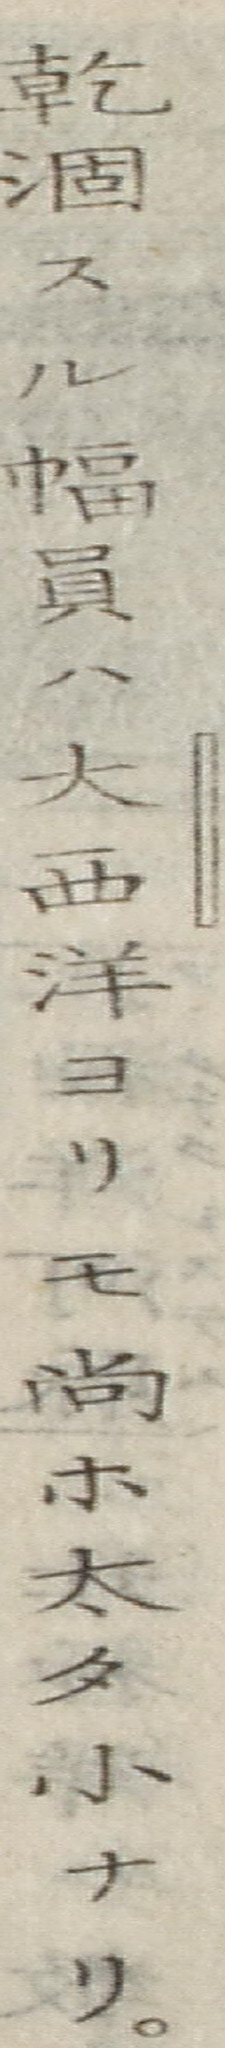乾涸スル幅員ハ大西洋ヨリモ尚太タ小ナリ。
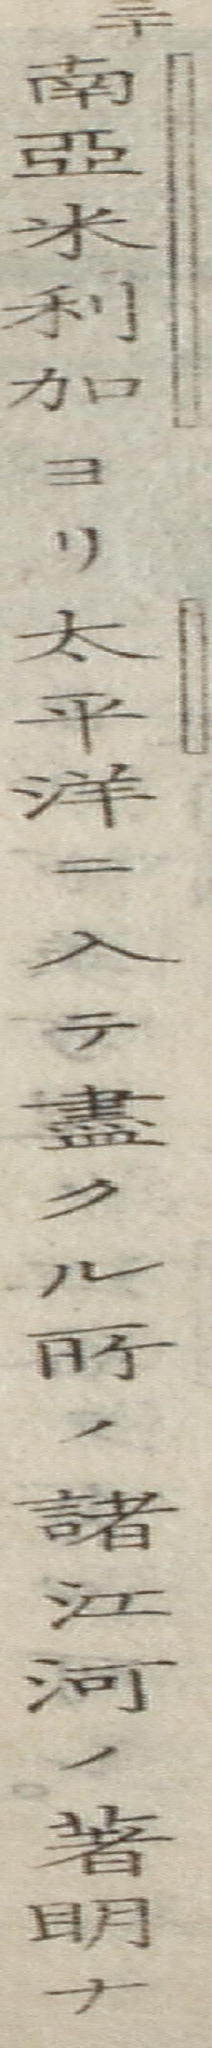三十南亜米利加ヨリ太平洋ニ入テ尽クル所ノ諸江河ノ著明ナ
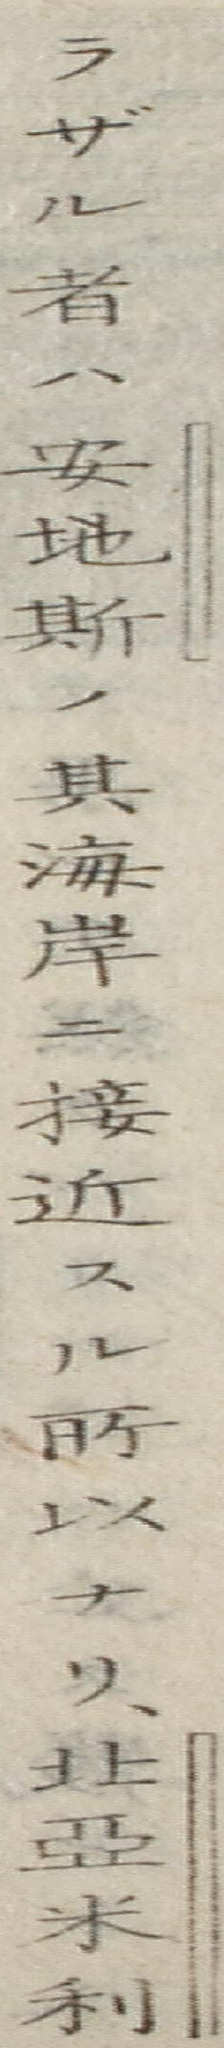ラザル者ハ安地斯ノ其海岸ニ接近スル所以ナリ、北亜米利
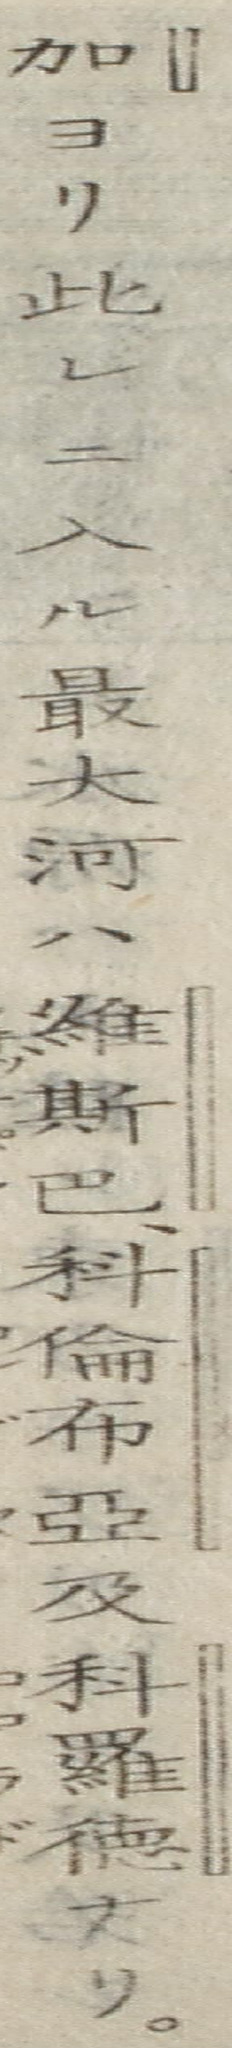加ヨリ此ニ入ル最大河ハ維斯巴、科倫布亜及科羅徳ナリ。
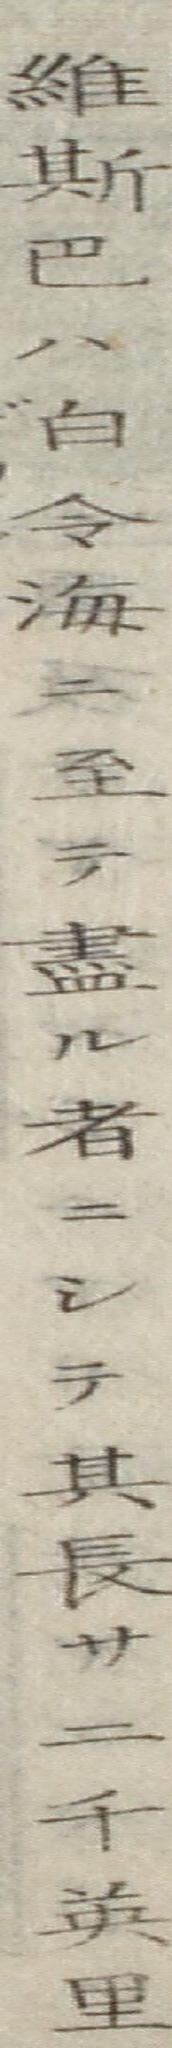維斯巴ハ白令海ニ至テ尽ル者ニシテ其長サ二千英里
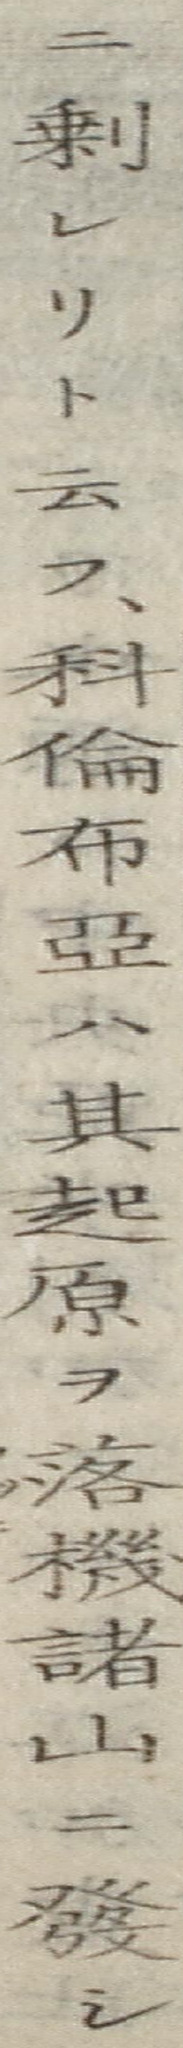二剰レリト云フ、科倫布亜ハ其起原ヲ落機諸山ニ発シ
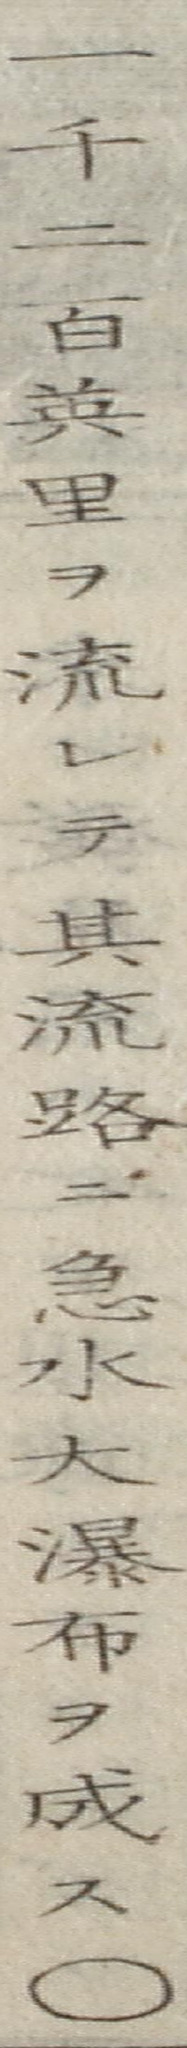一千二百英里ヲ流レテ其流路ニ急水大瀑布ヲ成ス○
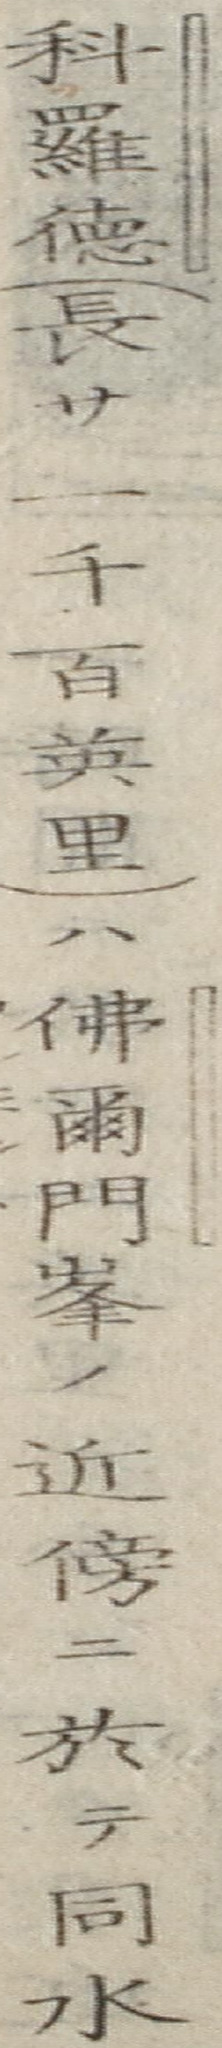科羅徳ハ佛爾門峯ノ近傍ニ於テ同水
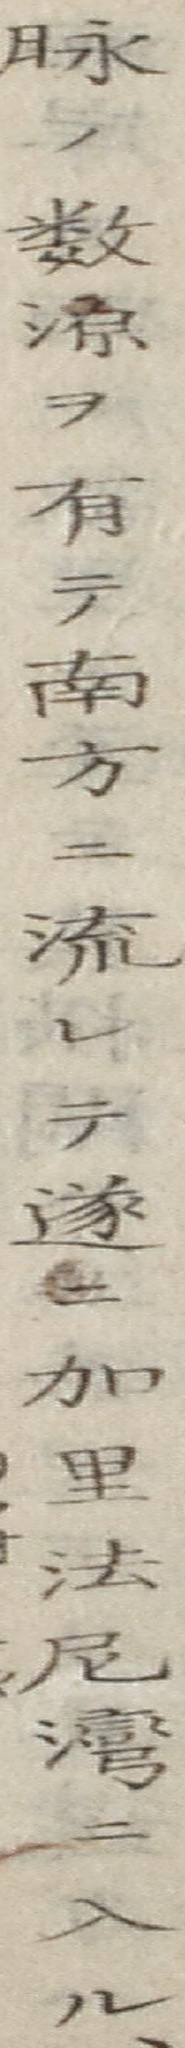脈ノ数源ヲ有テ南方ニ流レテ遂ニ加里法尼湾ニ入ル、
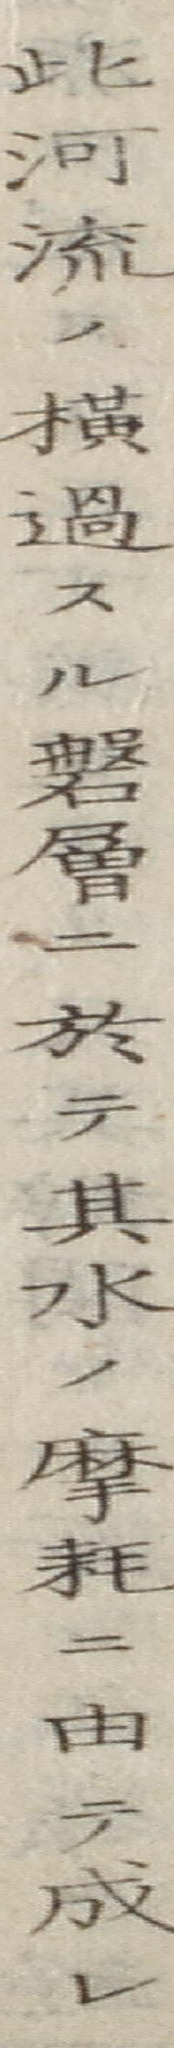此河流ノ横過スル盤層ニ於テ其水ノ摩耗ニ由テ成レ
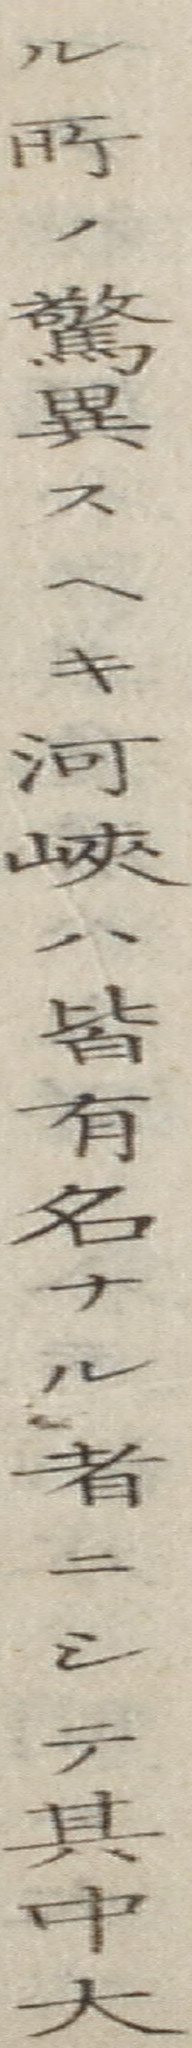ル所ノ驚異スヘキ河峡ハ皆有名ナル者ニシテ其中大
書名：地形論　巻二
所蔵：東京大学地震研究所図書室 Earthquake Research Institute Library, The University of Tokyo, JAPAN
